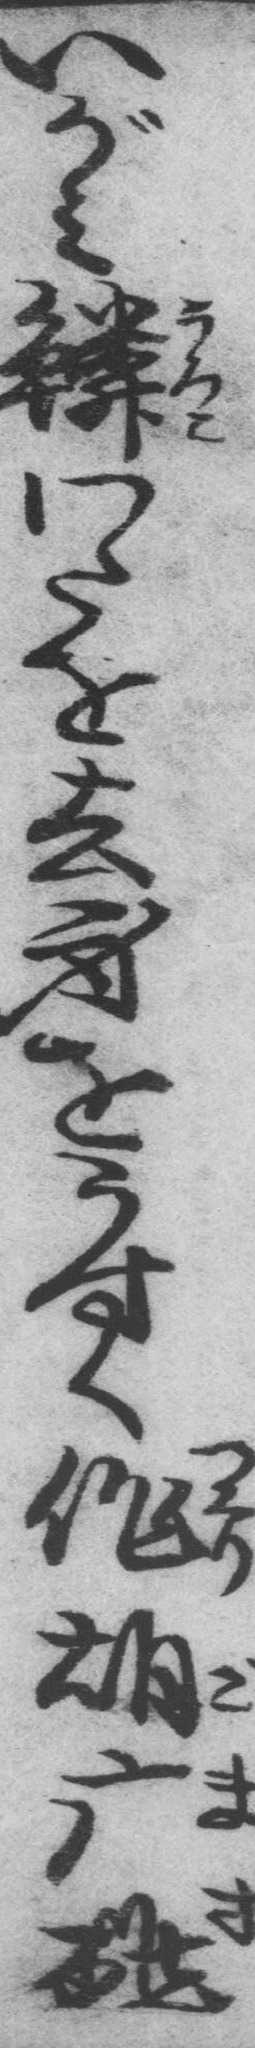いがみ鱗わたを去身をうすく作胡麻酢
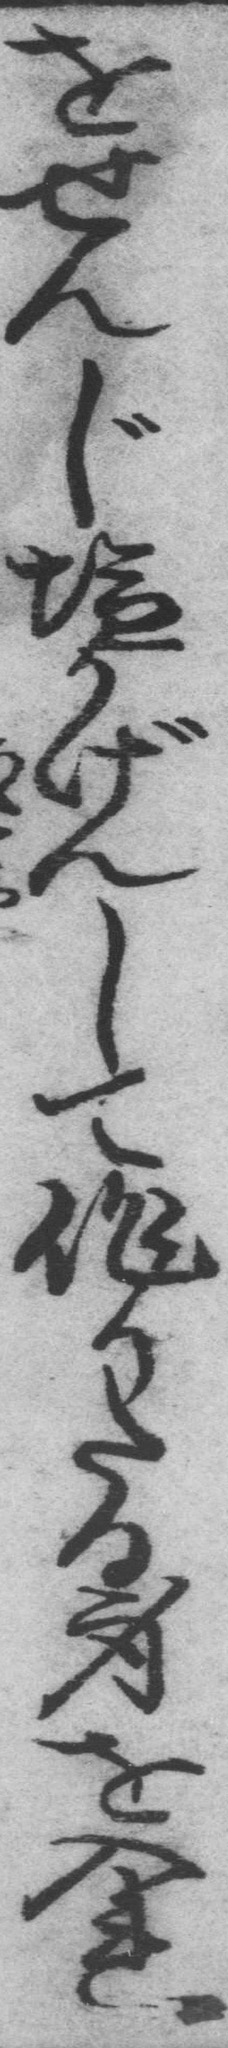をせんじ塩かげんして作りたる身を入れ
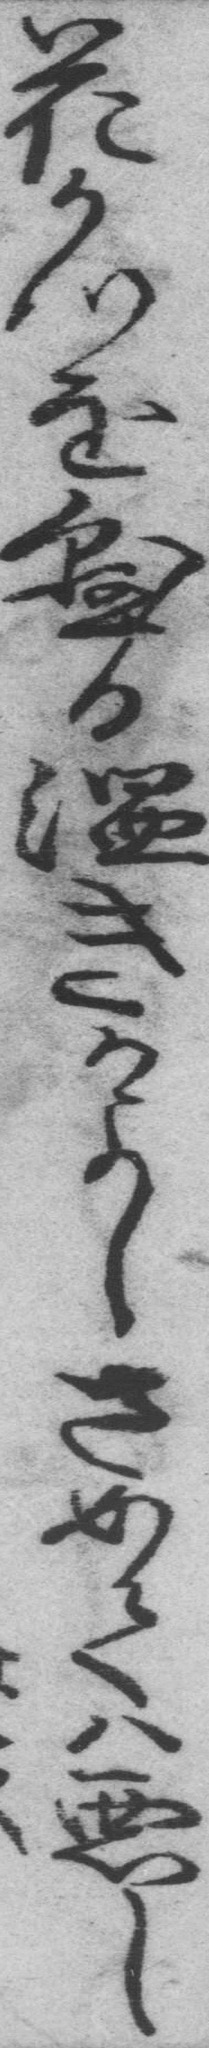花かつを懸る温きかよしさめては悪し
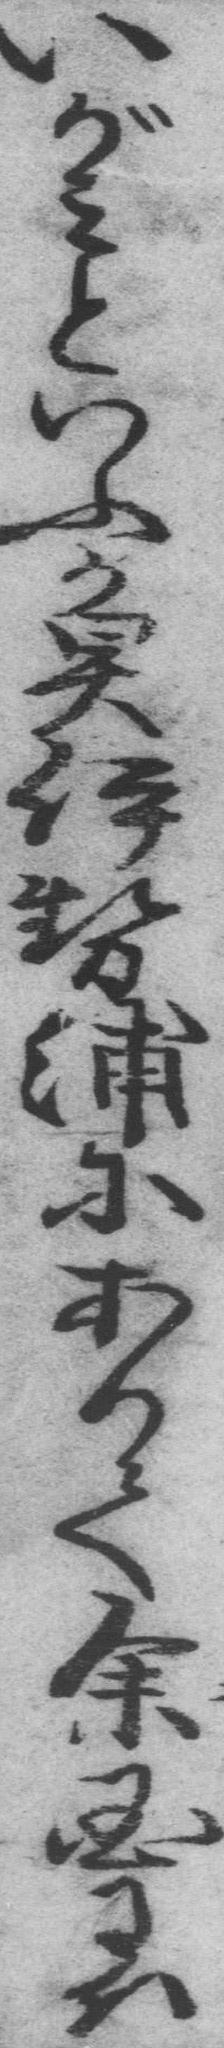いがみといふ魚伊勢浦にあつて余国には

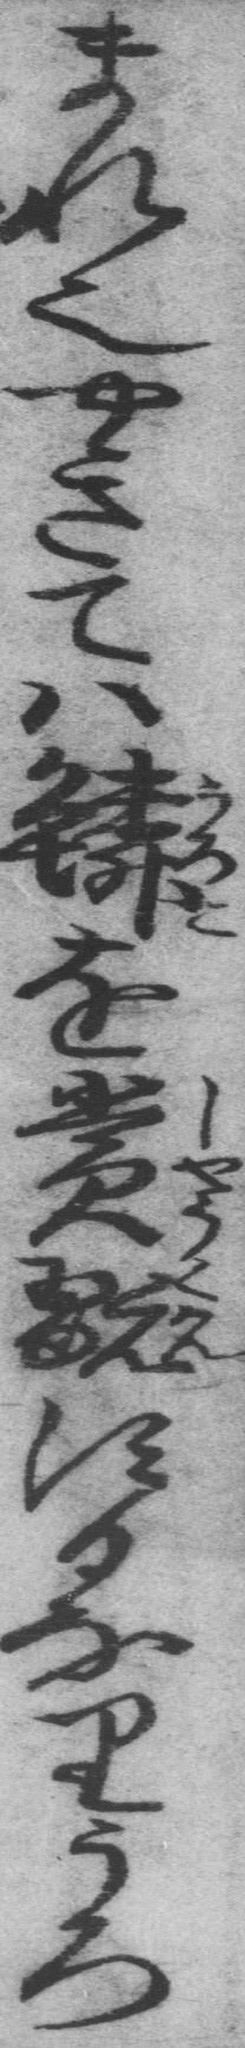まれ也やきては鱗を賞翫するなりうろ
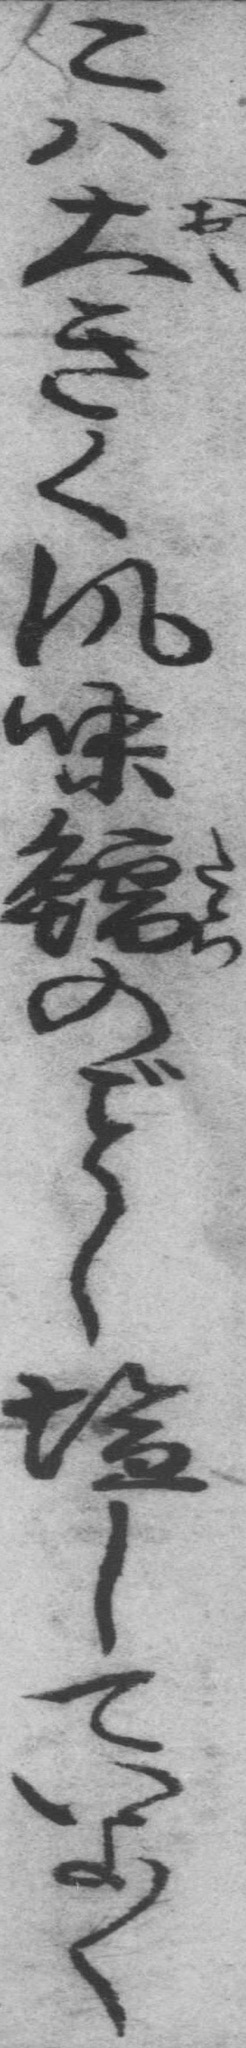こは大きく風味鱈のごとし塩していよ〳〵
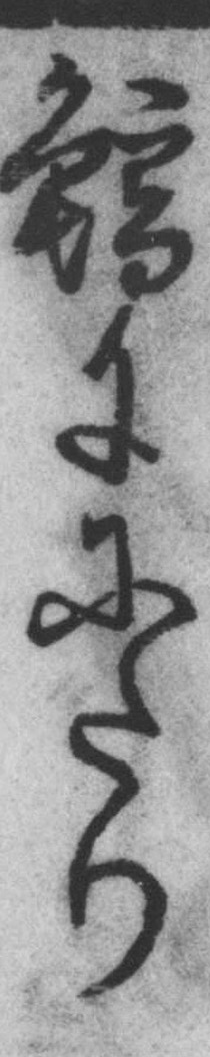鱈ににたり
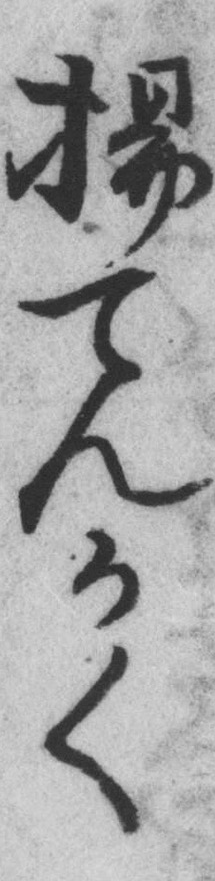揚てんかく
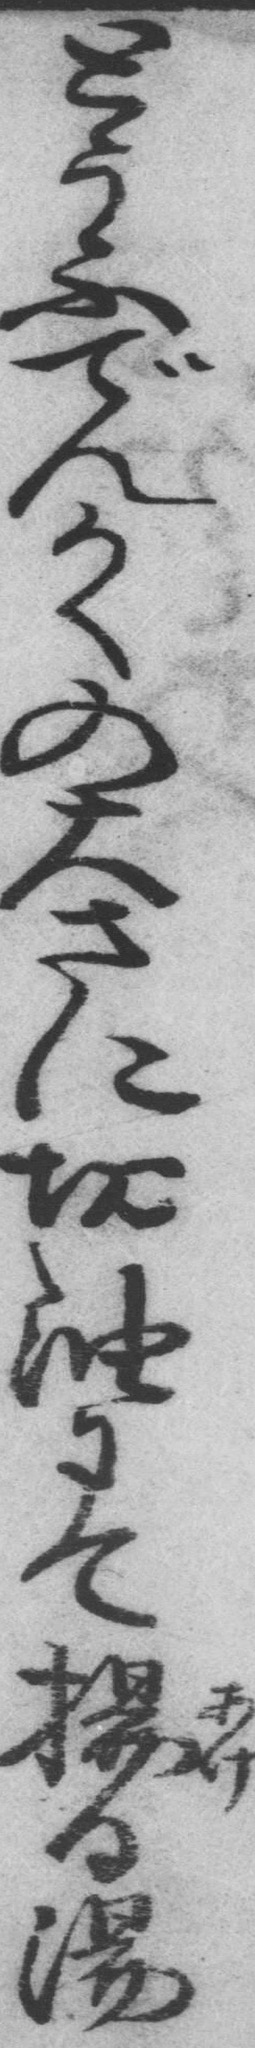とうふでんかくの大さに切油にて揚る湯
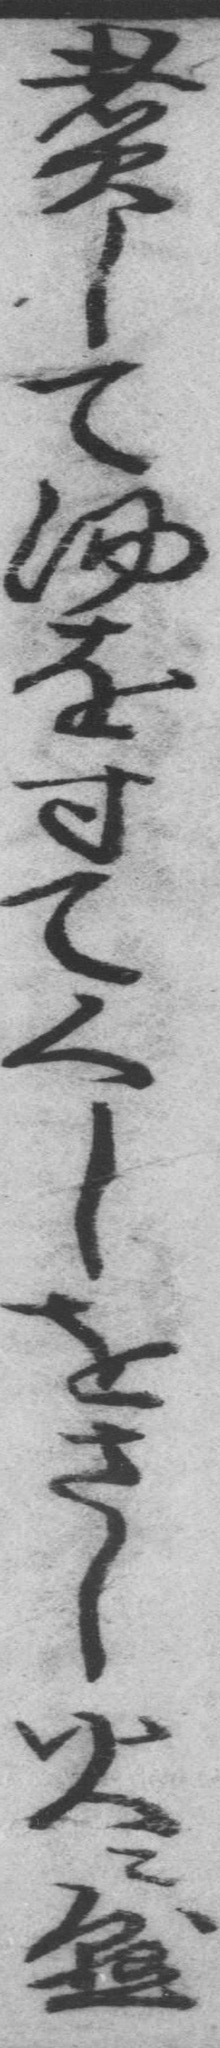煮して油をすてくしをさし火に懸
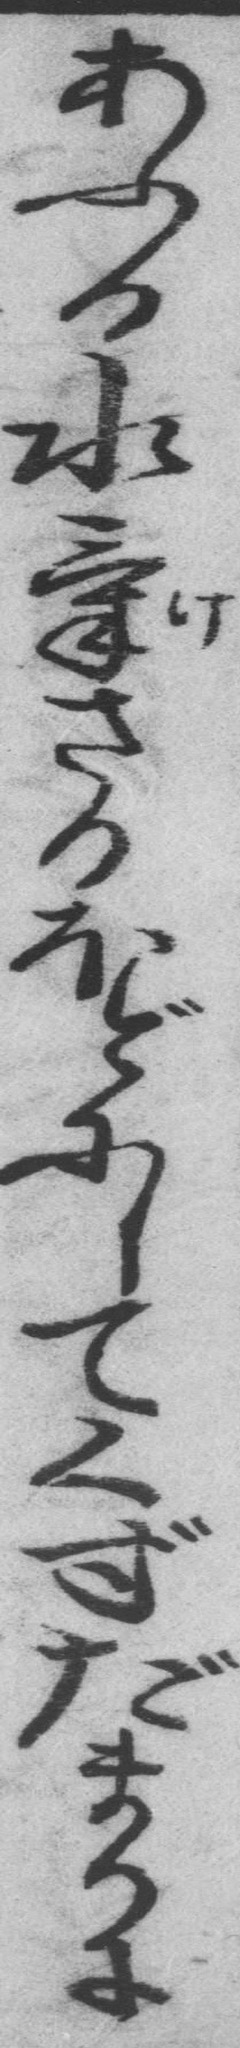あふる水気さるほどにしてくずだまりに
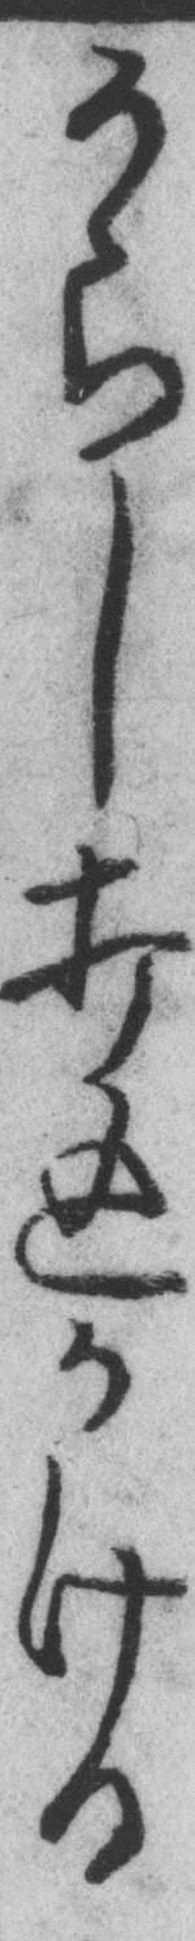からし打込かける
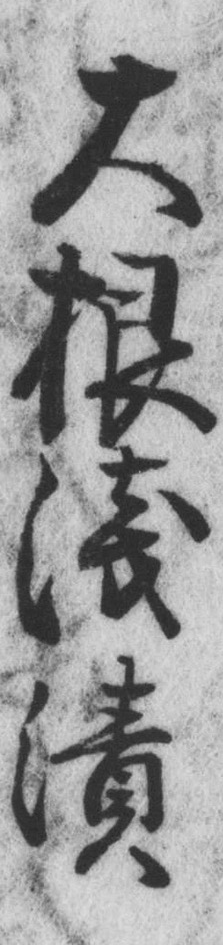大根浅漬
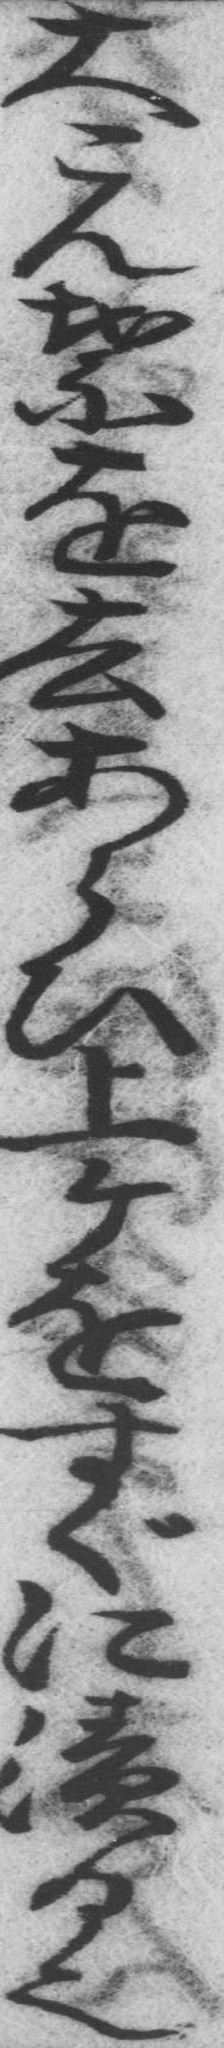大こん葉を去あらひ上ヶをすぐに漬る也
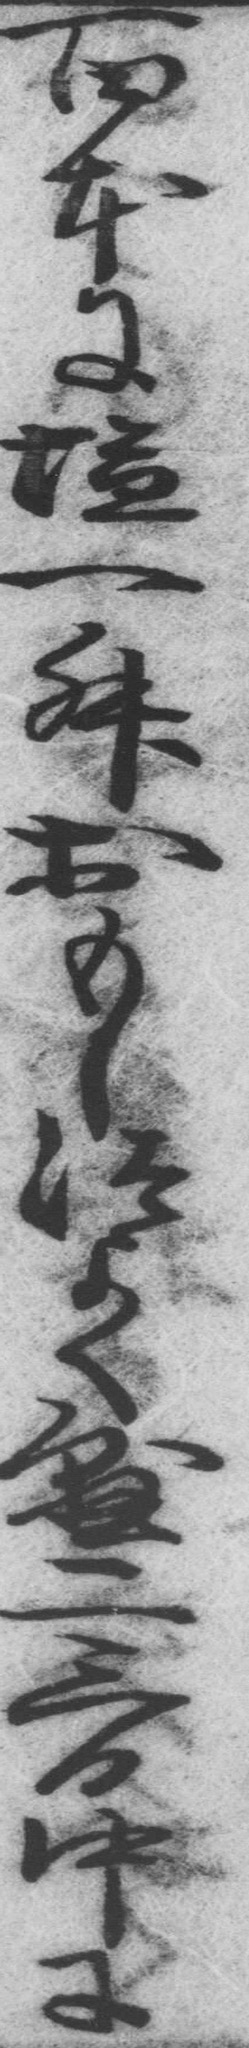百本に塩一升おもしつよく懸二三日中に
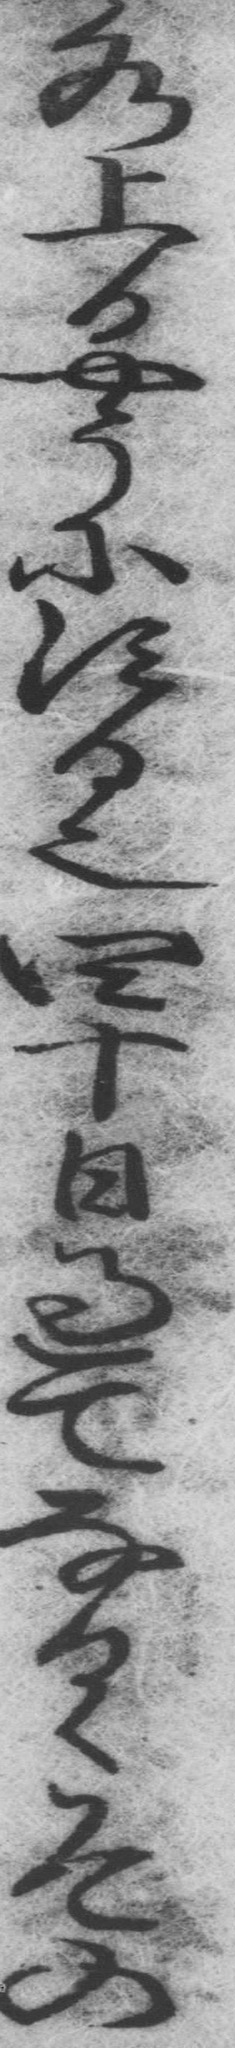水右上るやうにする也四十日過てなるゝその
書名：料理山海郷
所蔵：大阪府立大学学術情報センター 国文学研究資料館
